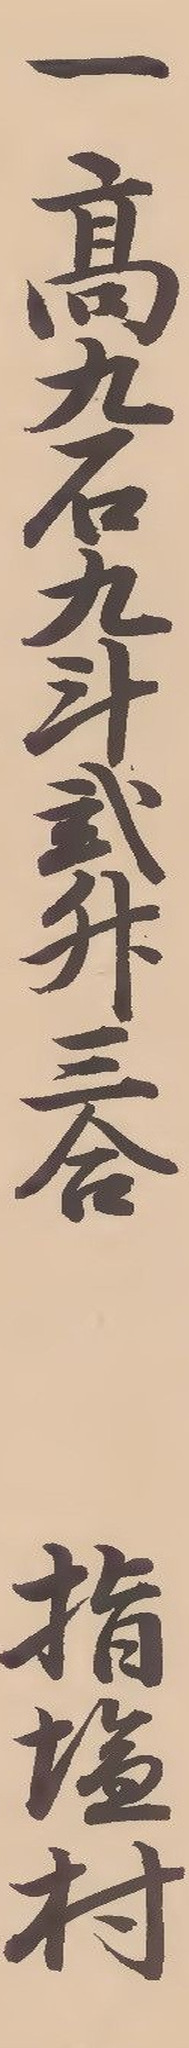一高九石九斗弐升三合指塩村

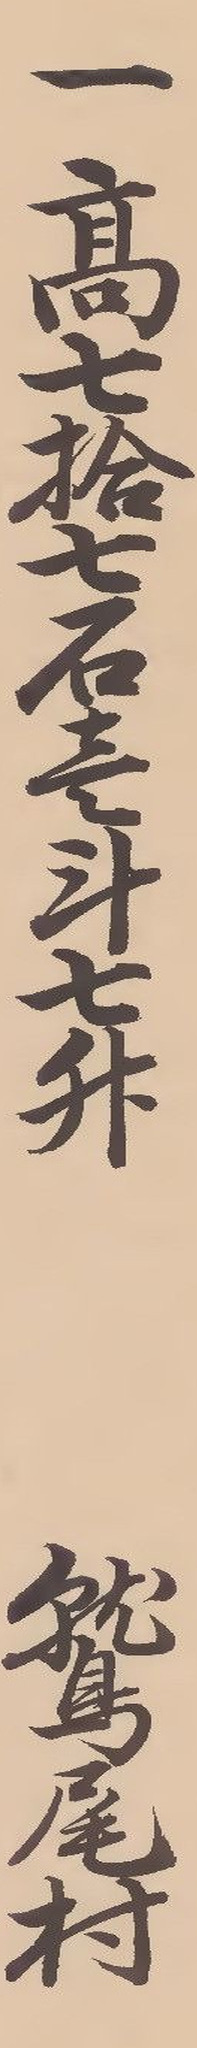一高七拾七石壱斗七升鷲尾村
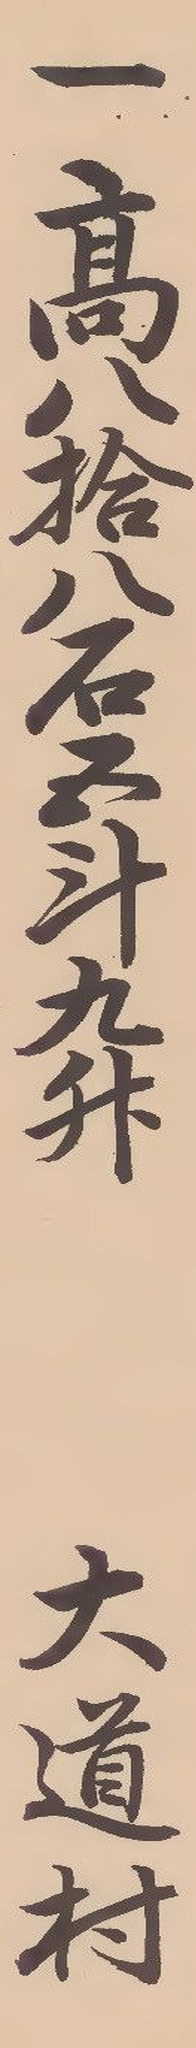一高八拾八石五斗九升大道村
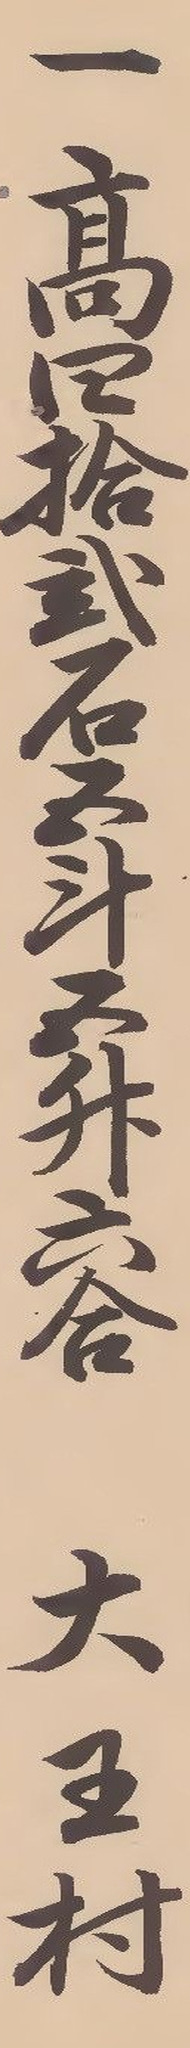一高四拾弐石五斗五升六合大王村
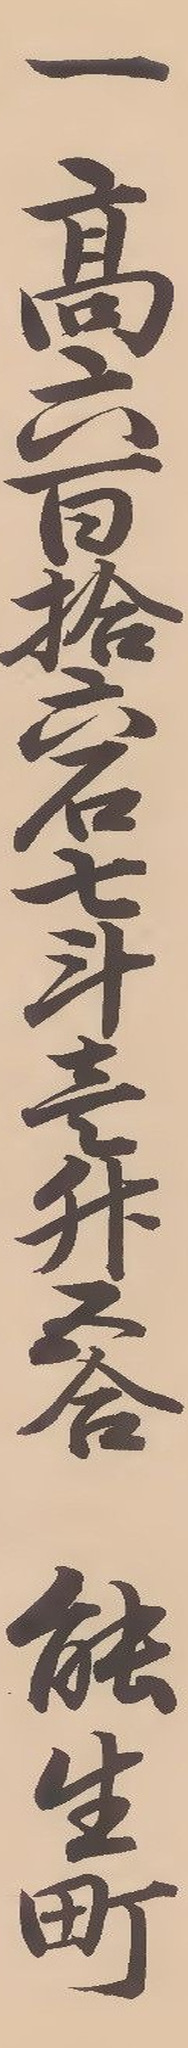一高六百拾六石七斗壱升五合能生町
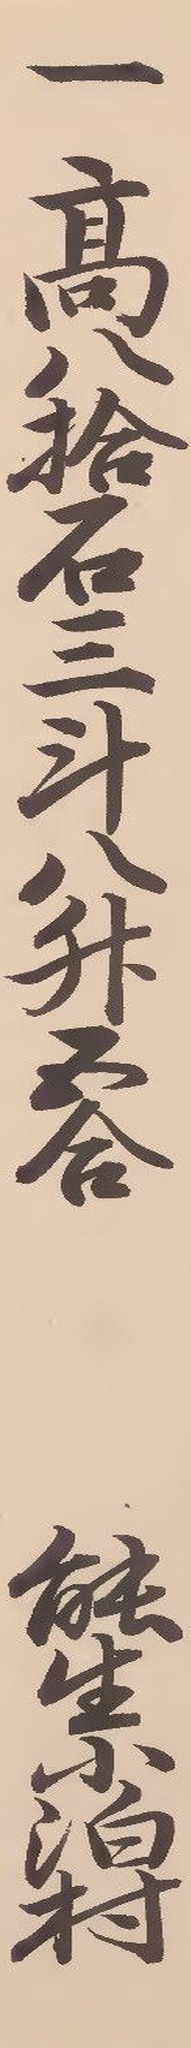一高八拾石三斗八升五合能生小泊村
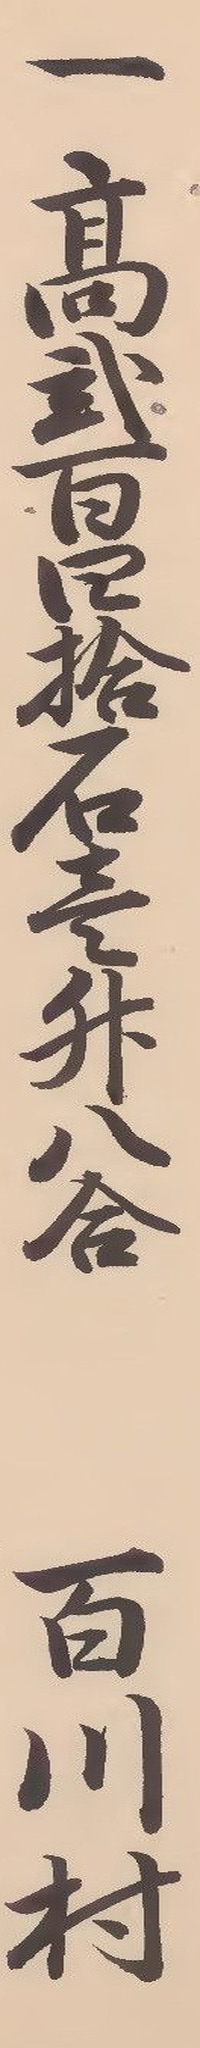一高弐百四拾石壱升八合百川村
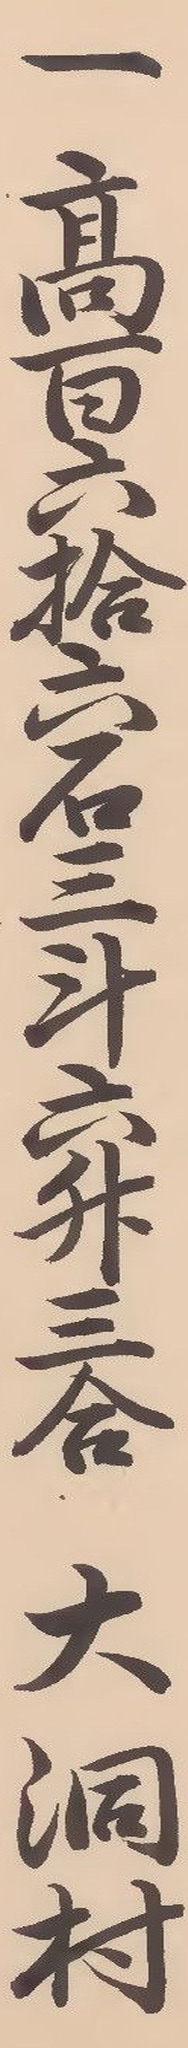一高百六拾六石三斗六升三合大洞村
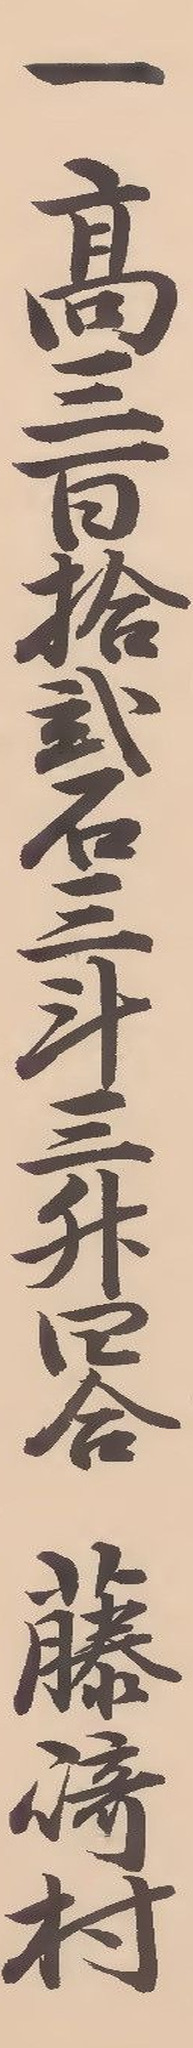一高三百拾弐石三斗三升四合藤崎村

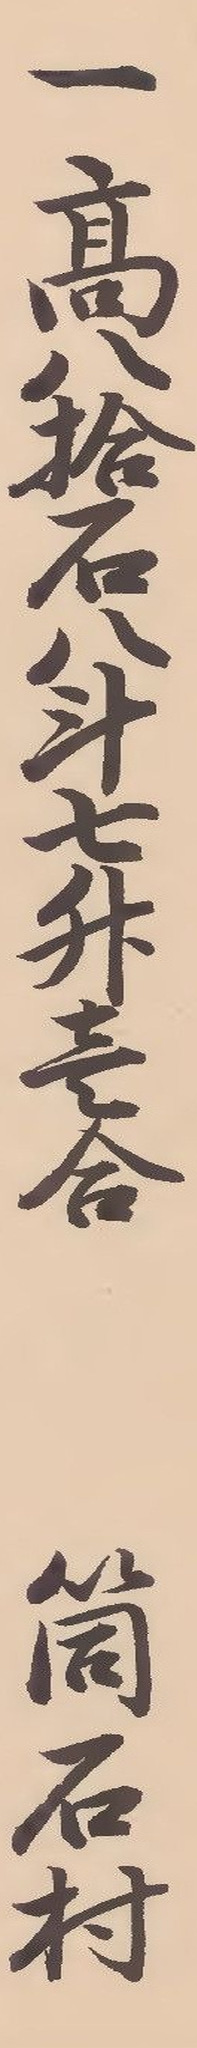一高八拾石八斗七升壱合筒石村
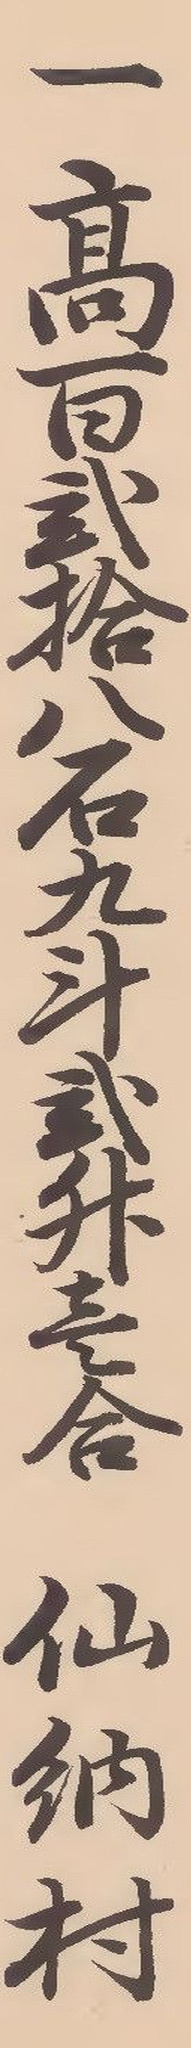一高百弐拾八石九斗弐升壱合仙納村
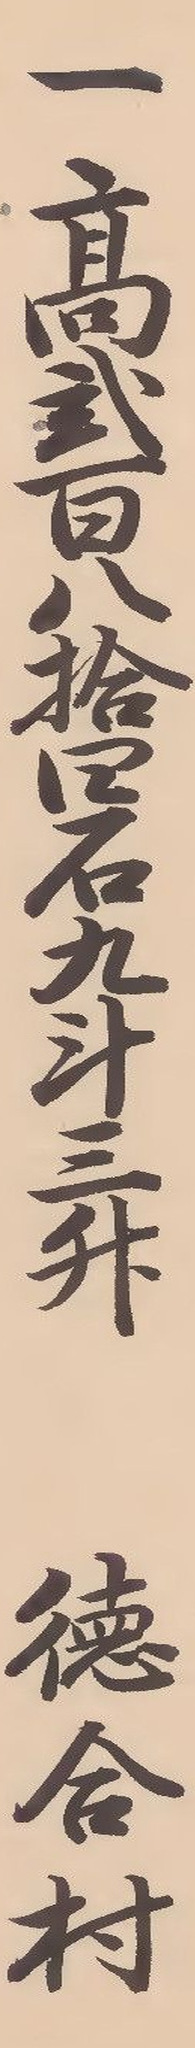一高弐百八拾四石九斗三升徳合村
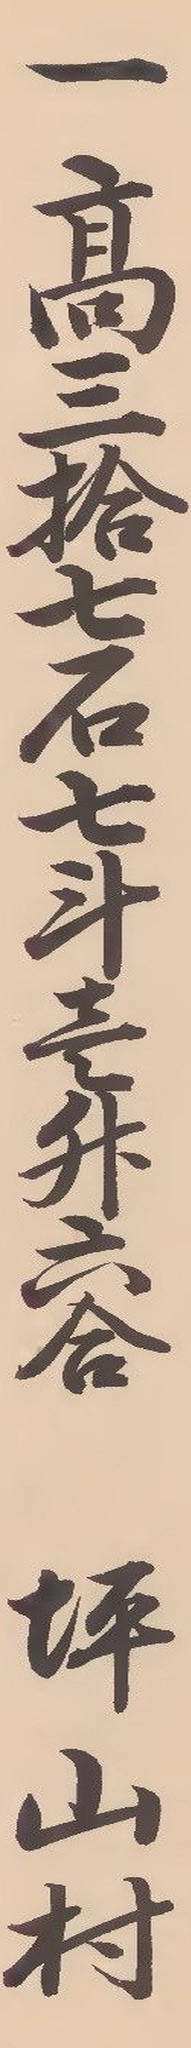一高三拾七石七斗壱升六合坪山村
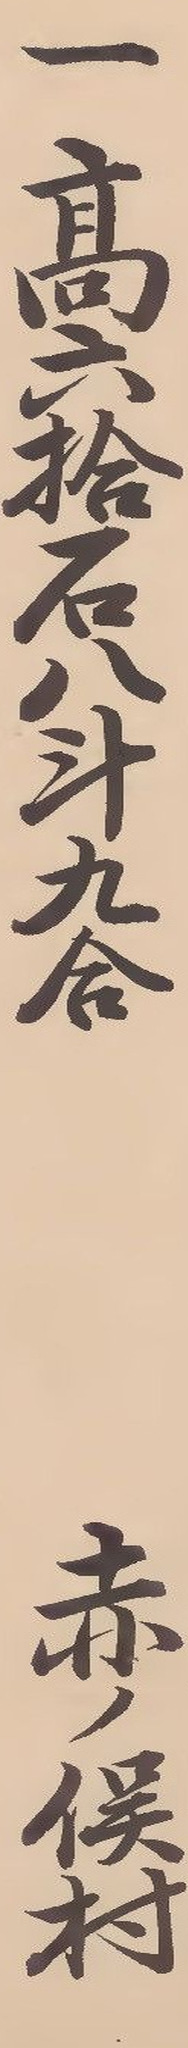一高六拾石八斗九合赤ノ俣村
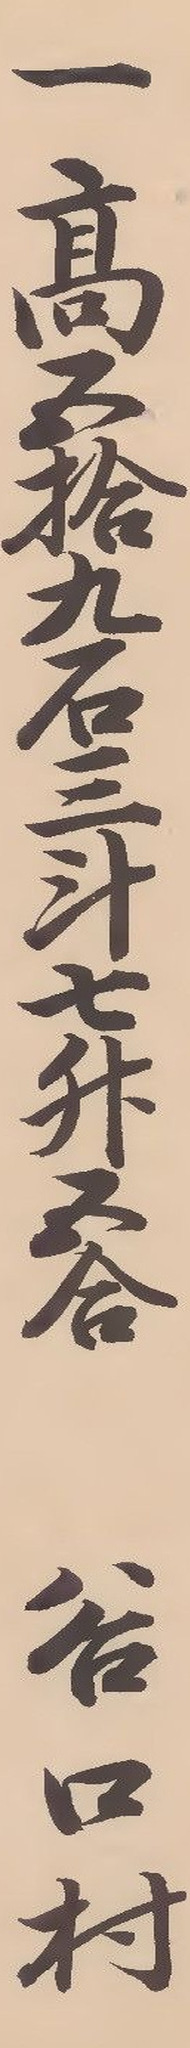一高五拾九石三斗七升五合谷口村
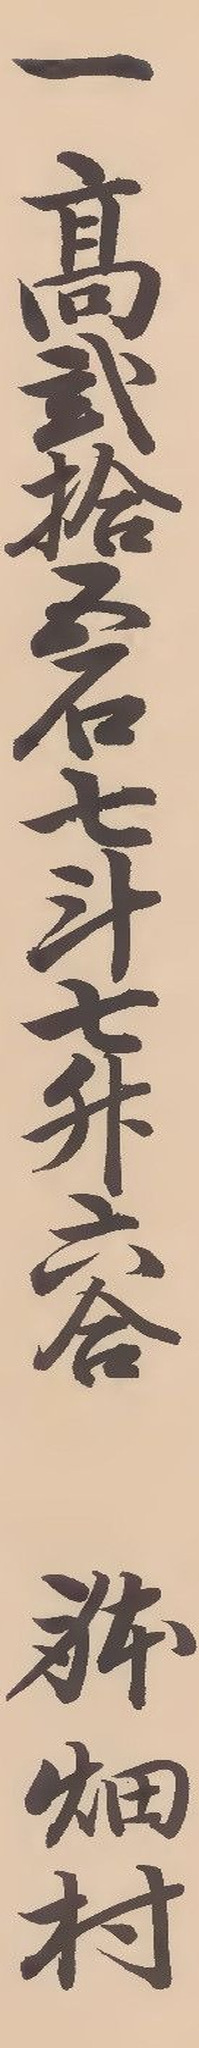一高弐拾五石七斗七升六合躰畑村
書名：越後国郷帳　上
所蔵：国立公文書館 National Archives of Japan
